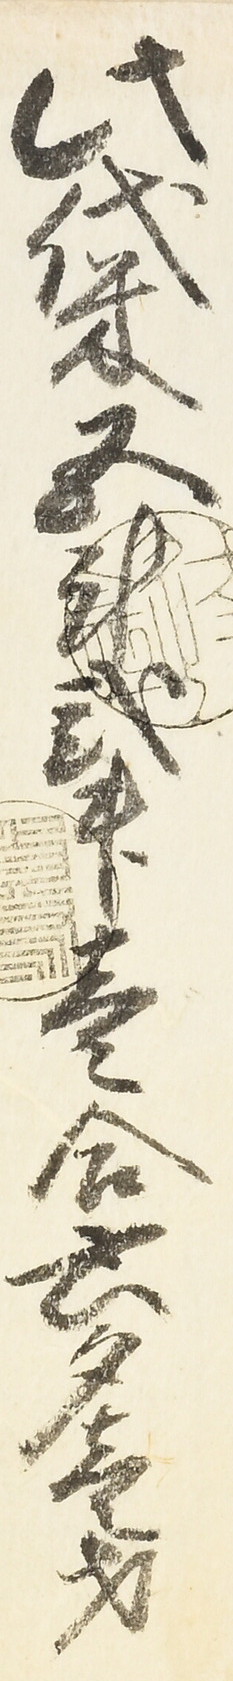此代米五斗弐升壱合六勺壱才
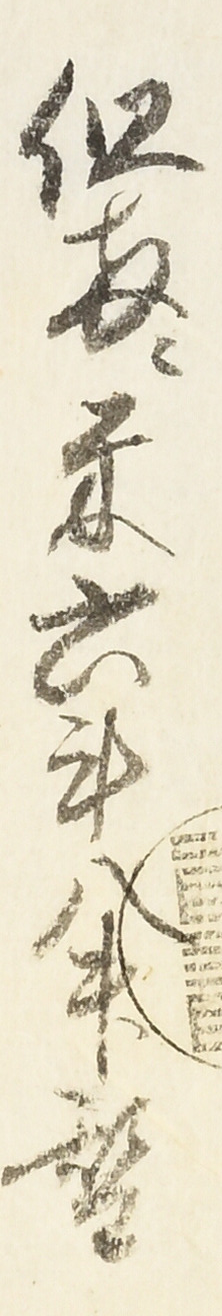但両ニ米六斗八升替

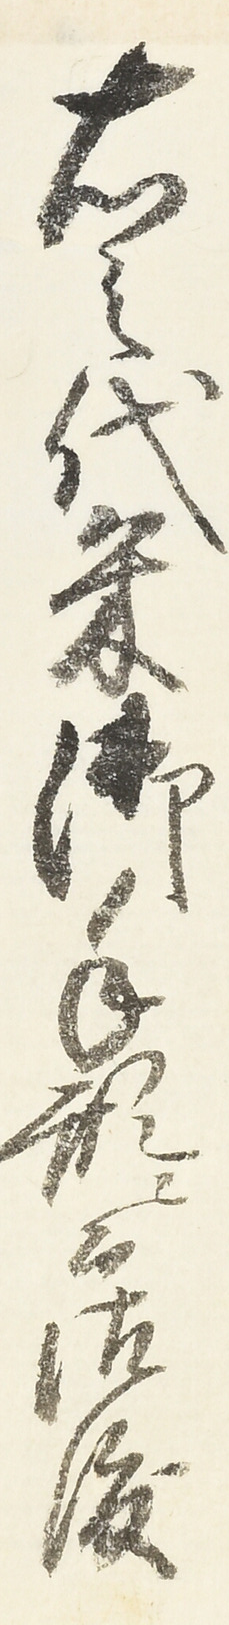右之代米御手形ニ而御渡
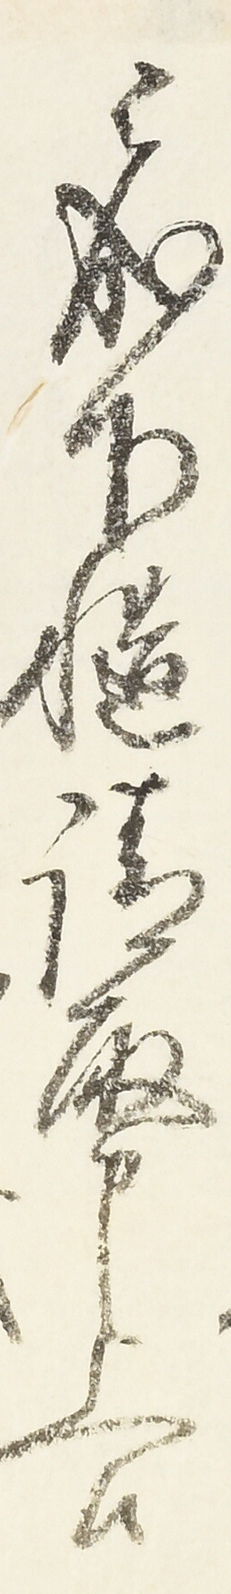被成下慥請取申上候
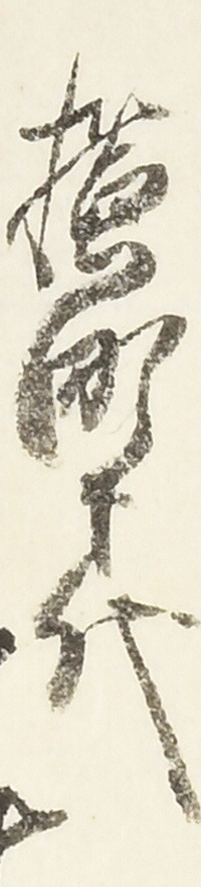横町丁代
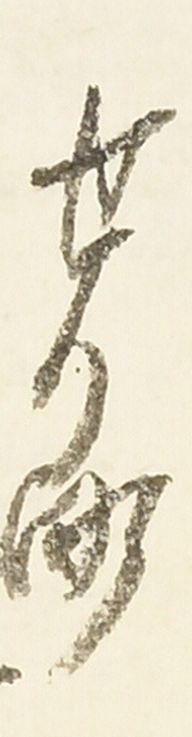せり町
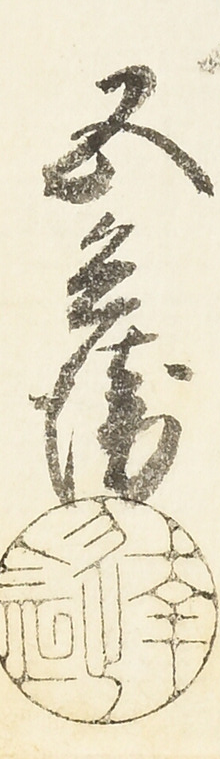五兵衛
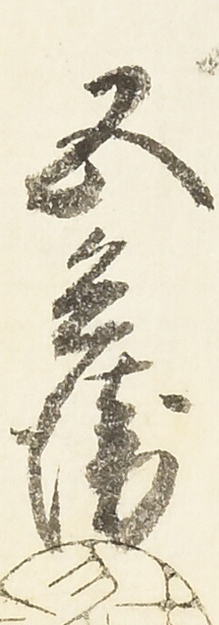五兵衛
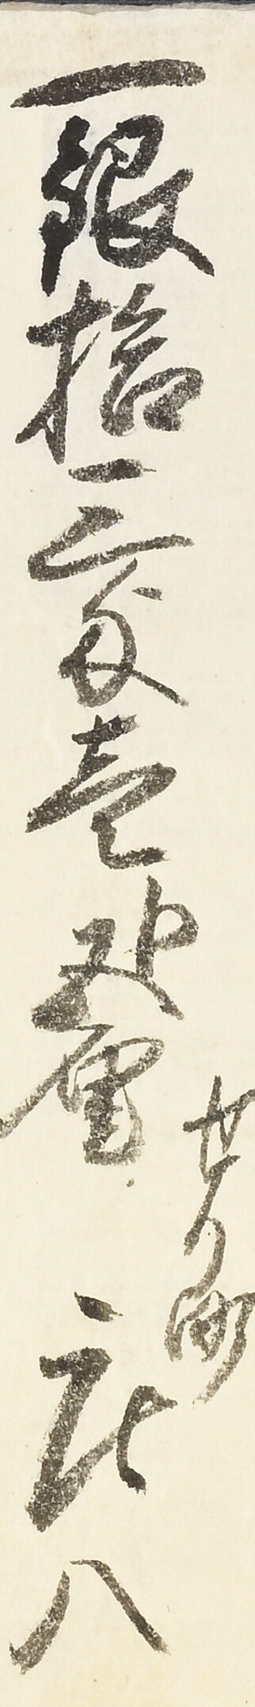一銀拾三匁壱分五厘庄八
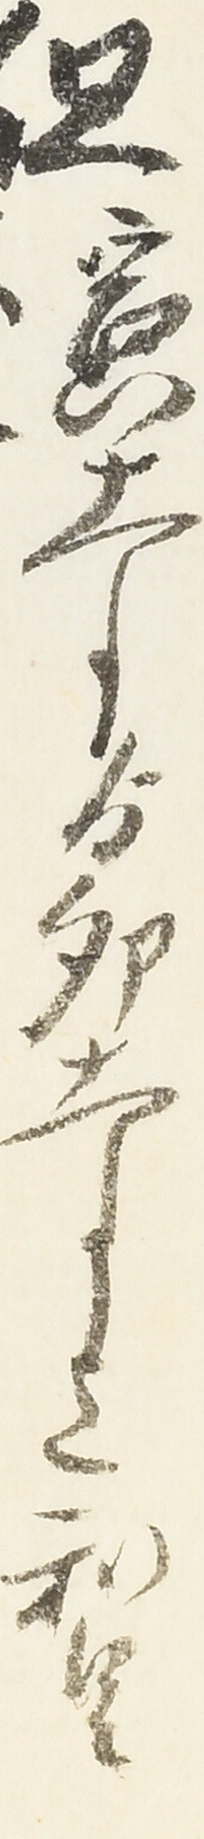但寅十一月ゟ卯十一月迄利足
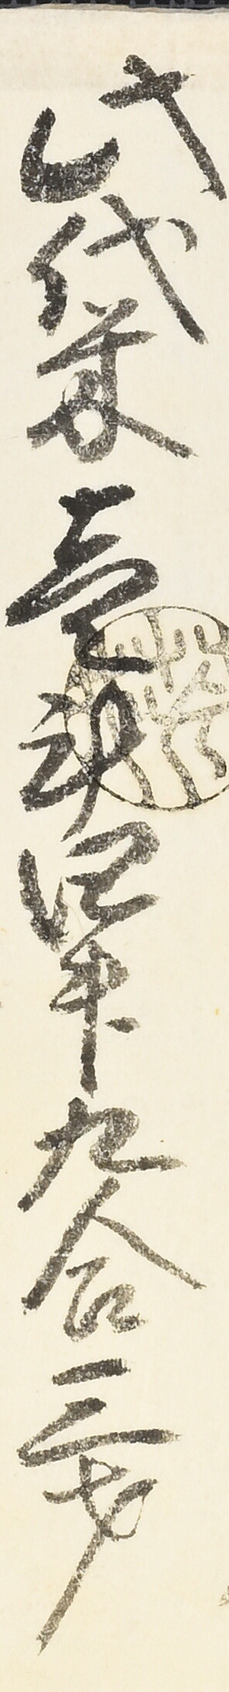此代米壱斗四升九合三才
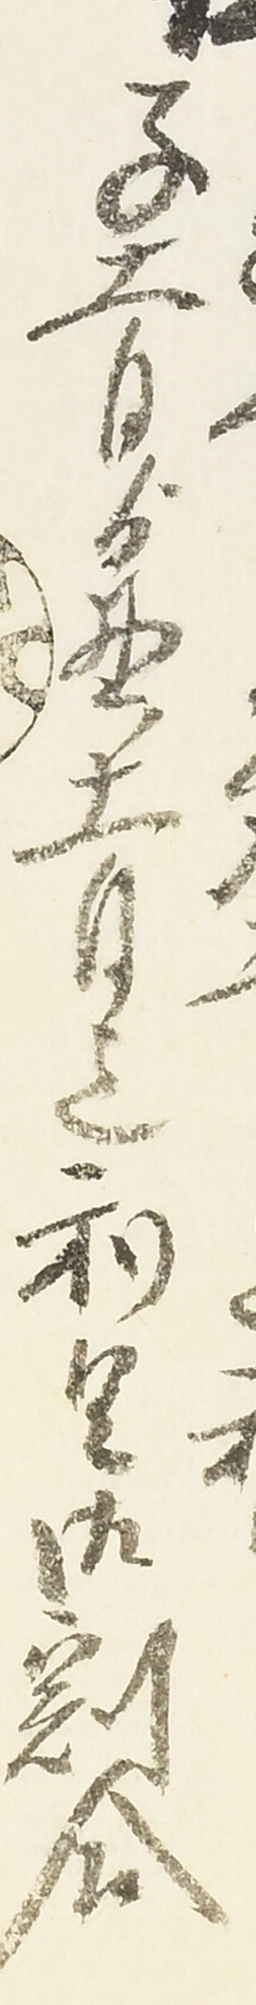子十一月ゟ丑ノ十一月迄利足御割合
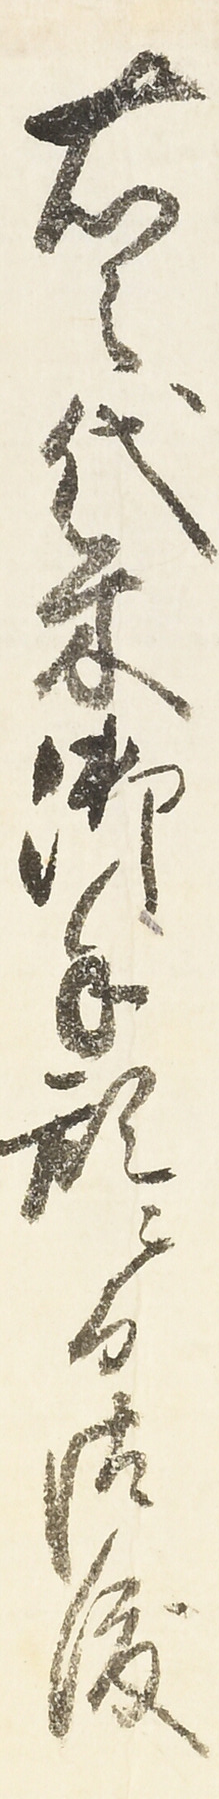右之代米御手形ニ而御渡
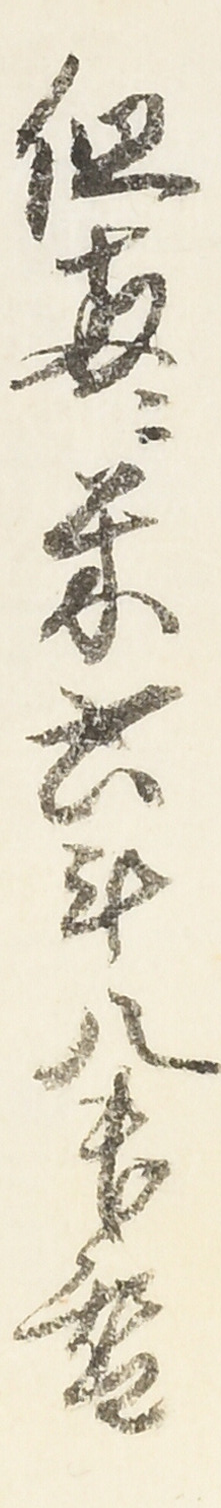但両ニ米六斗八升替
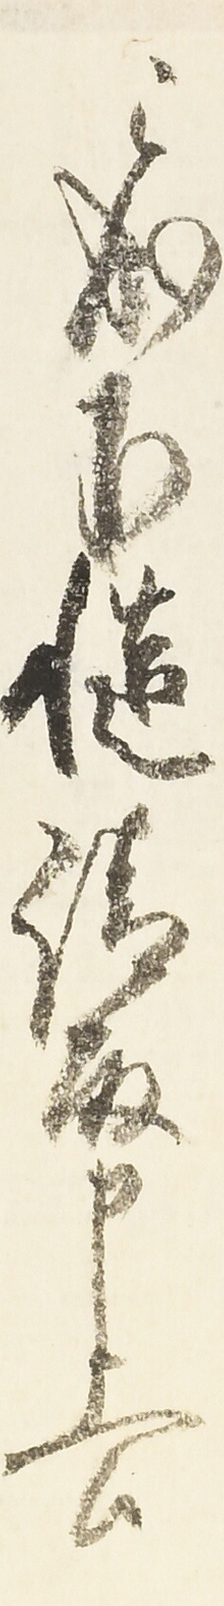被成下慥請取申上候
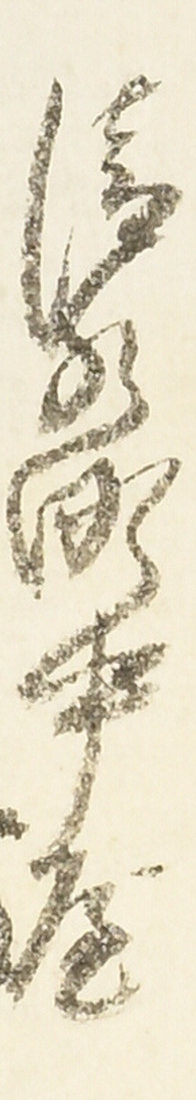清水町中屋
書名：御才覚金御利足割渡扣帳
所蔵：伊那市立高遠町図書館・合同会社AMANE
